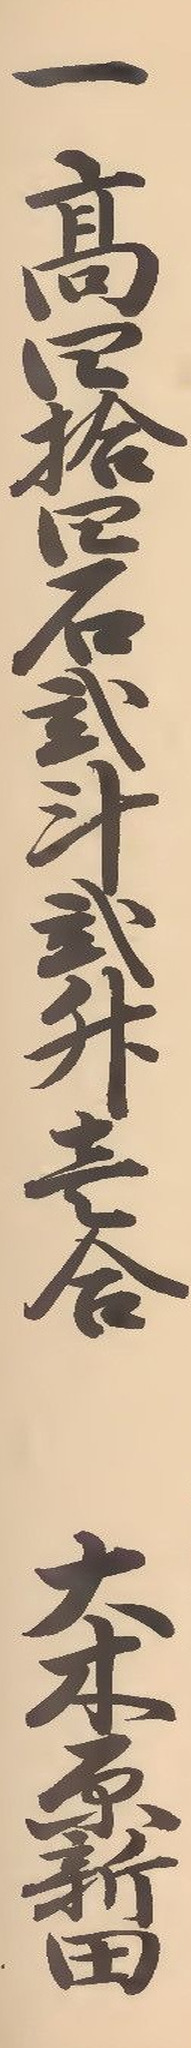一高四拾四石弐斗弐升壱合大木原新田
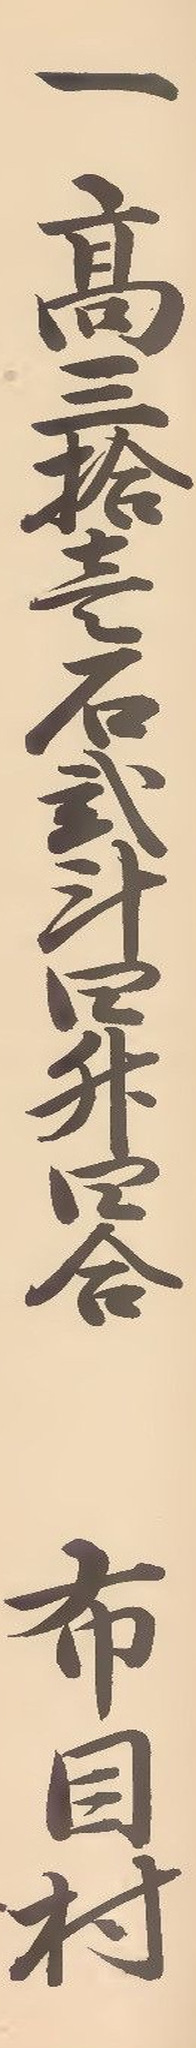一高三拾壱石弐斗四升四合布目村
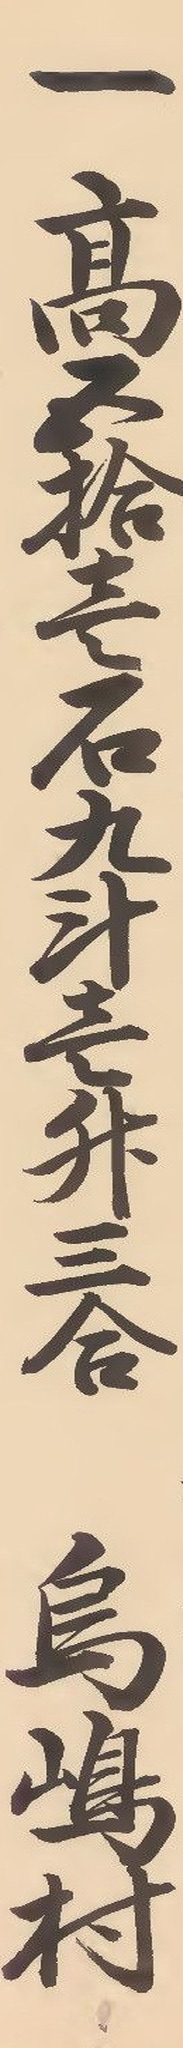一高五拾壱石九斗壱升三合烏島村
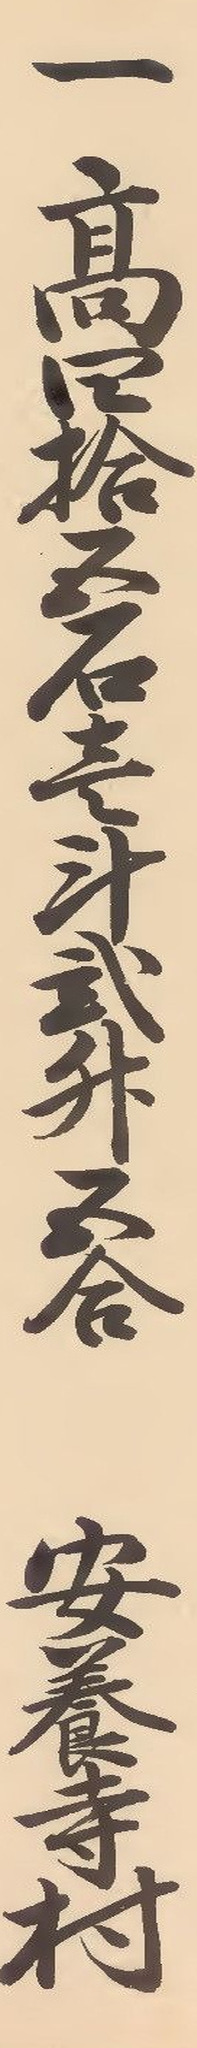一高四拾五石壱斗弐升五合安養寺村
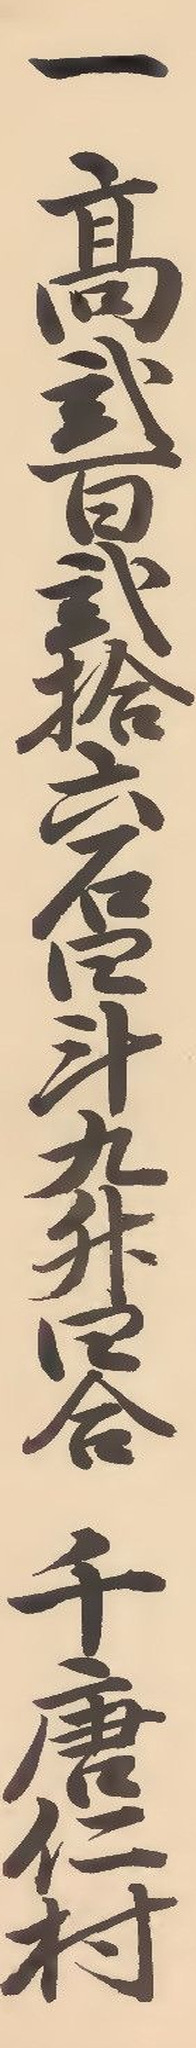一高弐百弐拾六石四斗九升四合千唐仁村

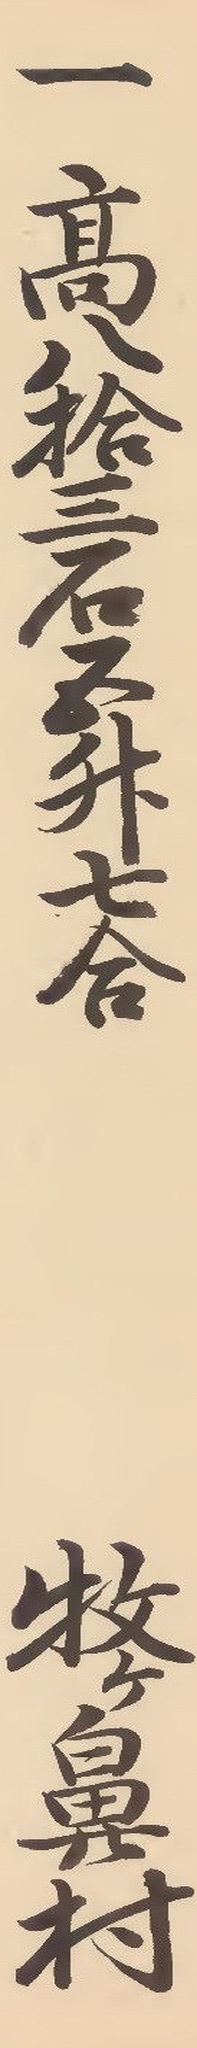一高八拾三石五升七合牧ヶ鼻村
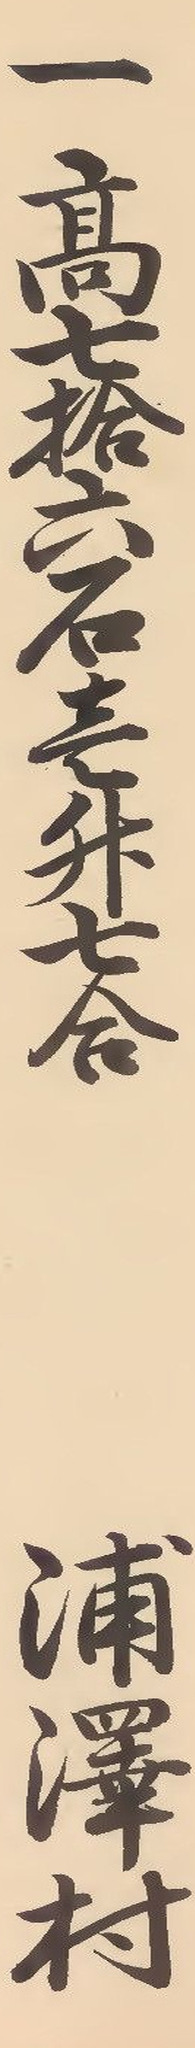一高七拾六石壱升七合浦沢村
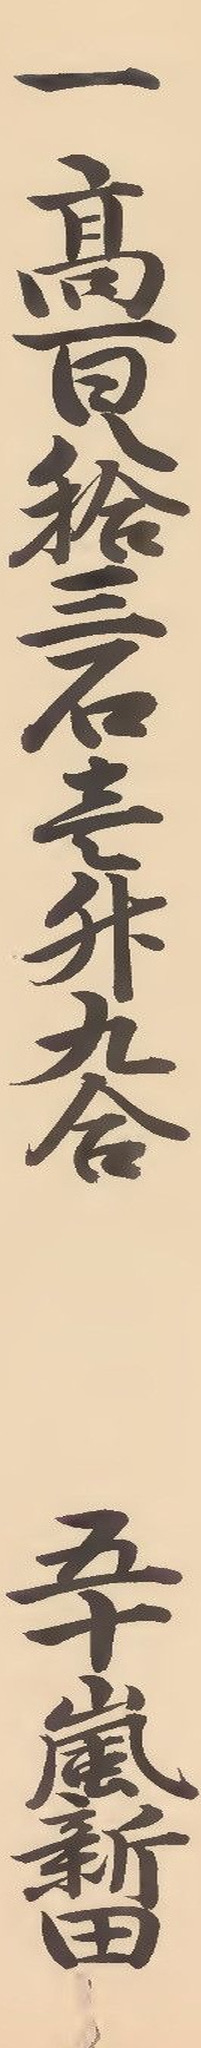一高百八拾三石壱升九合五十嵐新田
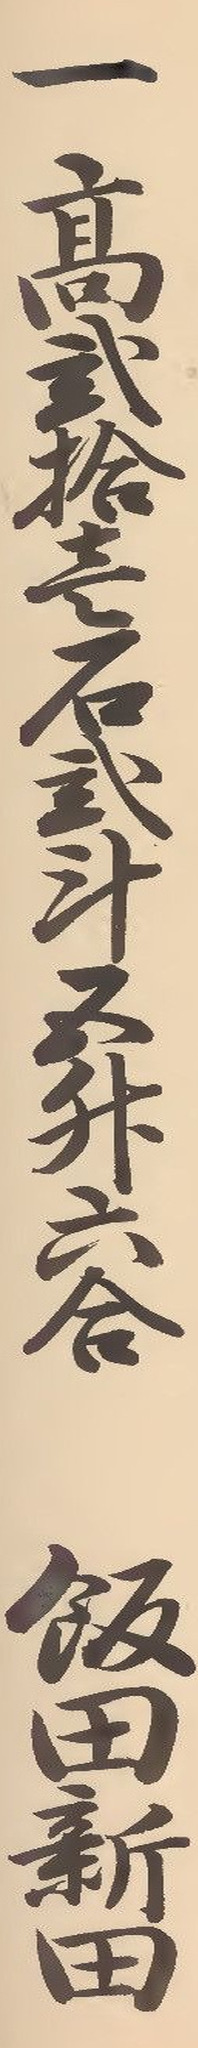一高弐拾壱石弐斗五升六合飯田新田
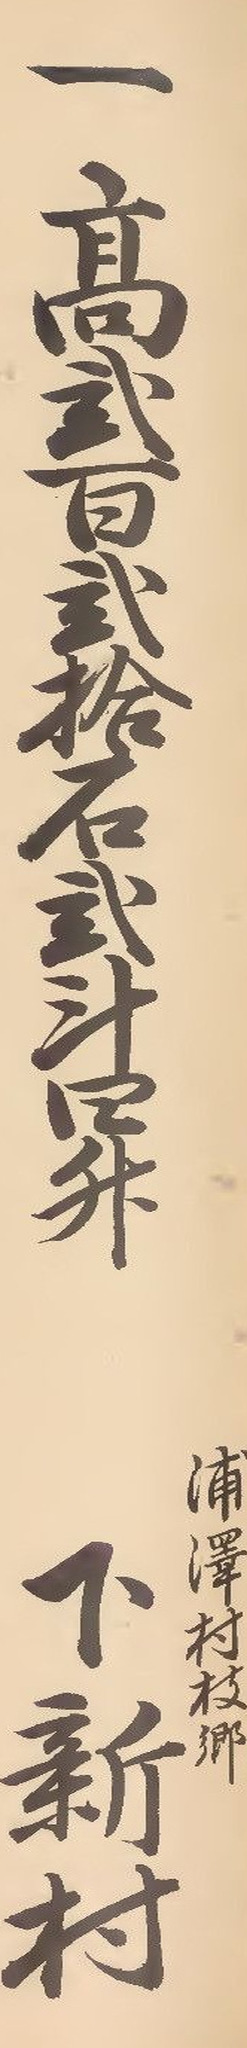一高弐百弐拾石弐斗四升下新村
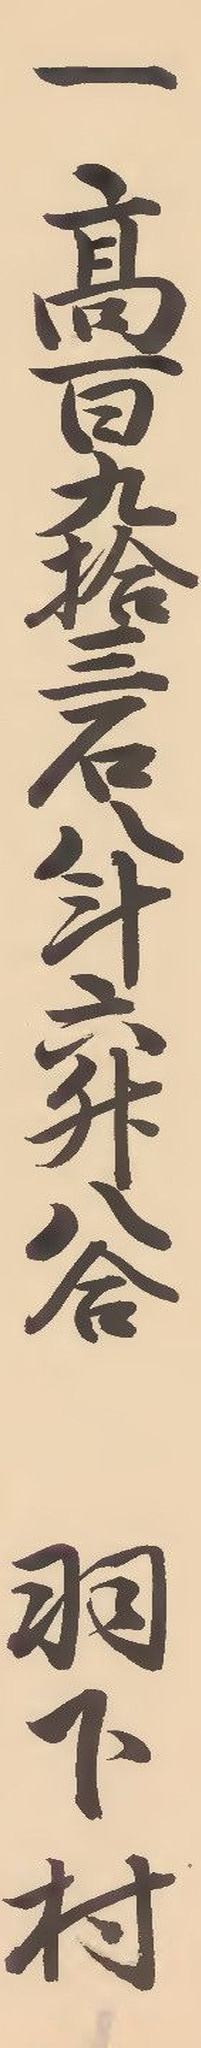一高百九拾三石八斗六升八合羽下村
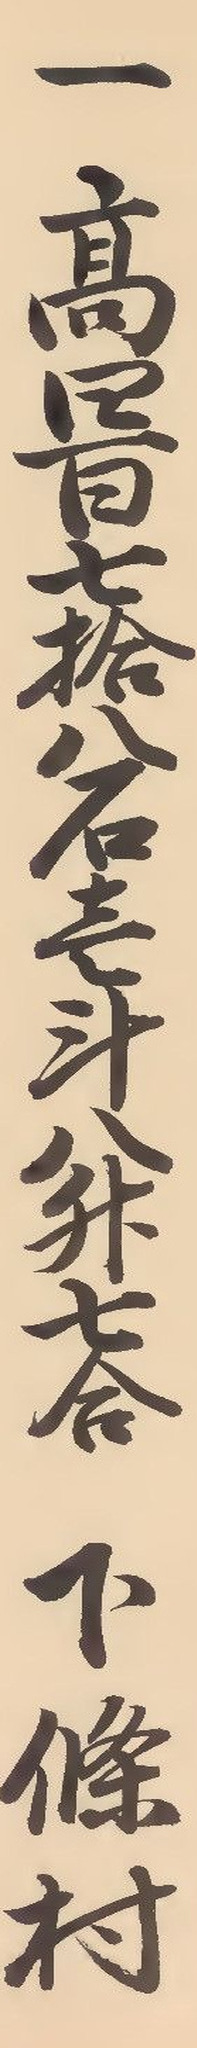一高四百七拾八石壱斗八升七合下条村
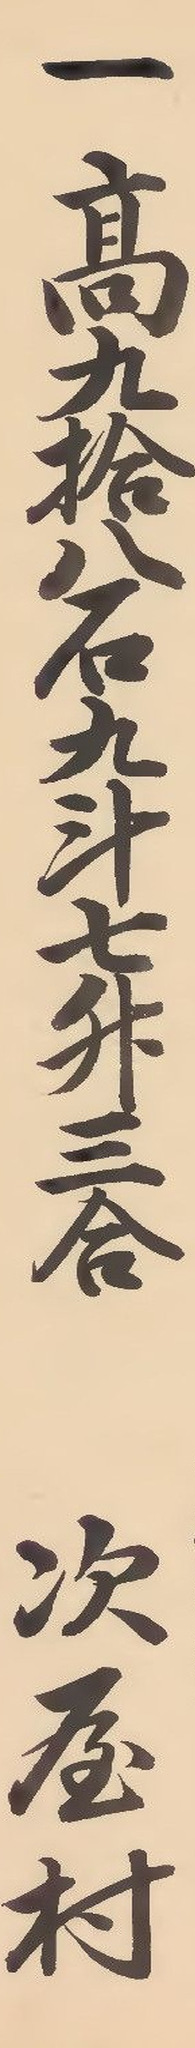一高九拾八石九斗七升三合次屋村

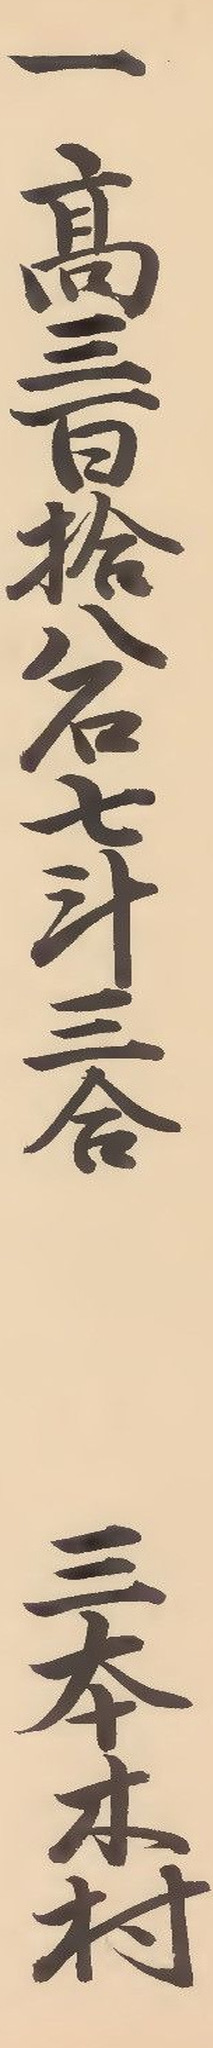一高三百拾八石七斗三合三本木村
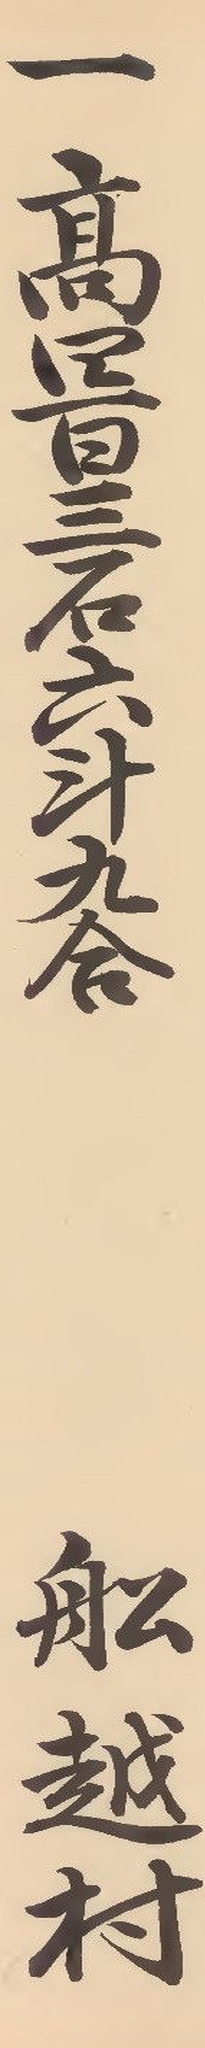一高四百三石六斗九合船越村
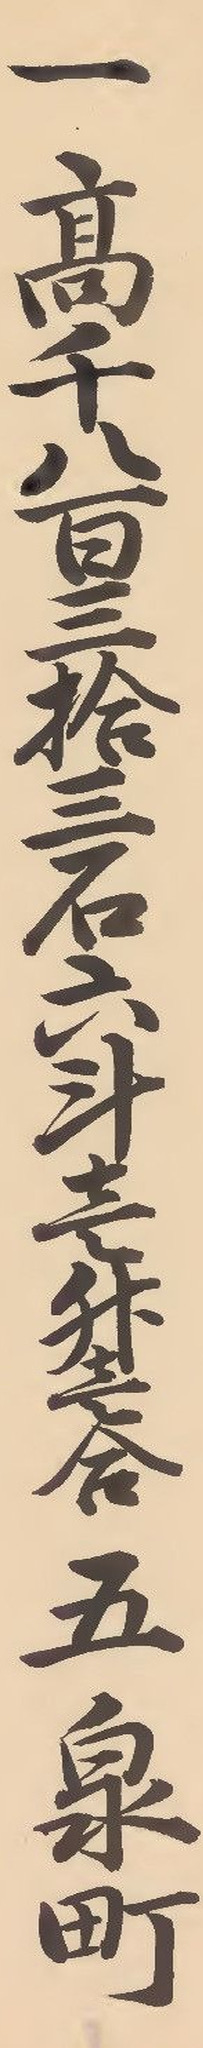一高千八百三拾三石六斗壱升壱合五泉町
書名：越後国郷帳　下
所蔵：国立公文書館 National Archives of Japan
